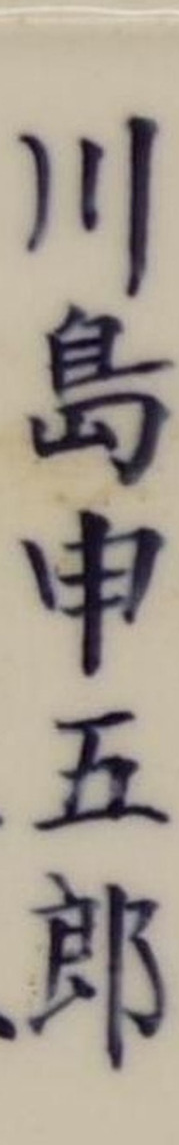川島申五郎

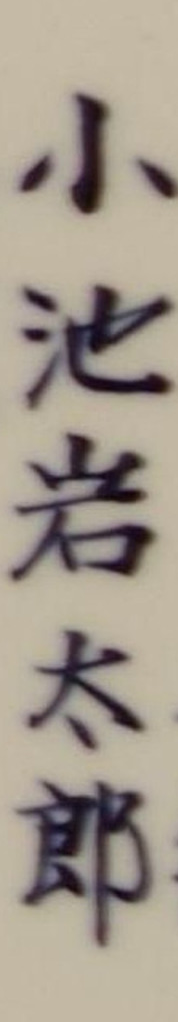小池岩太郎
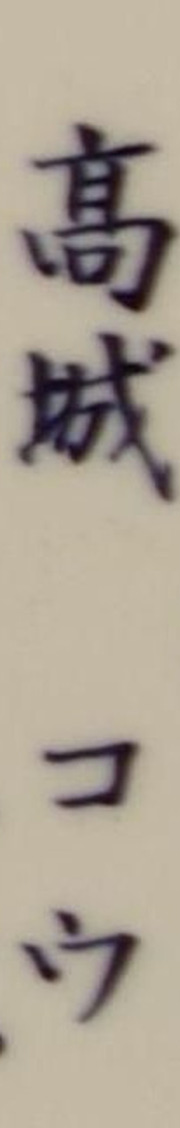高城コウ
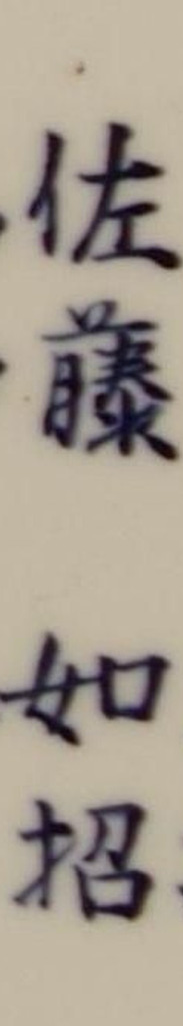佐藤如招
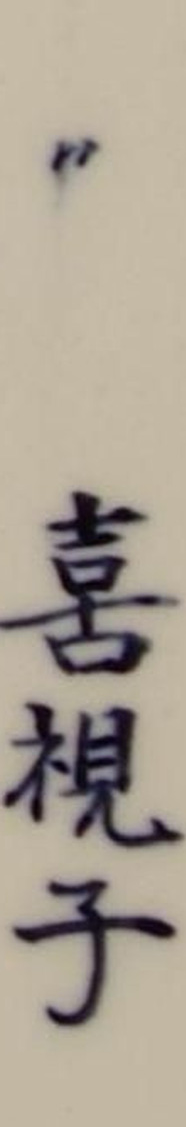喜視子
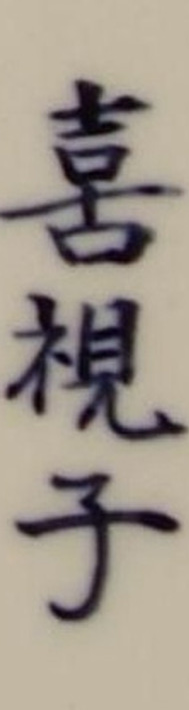喜視子
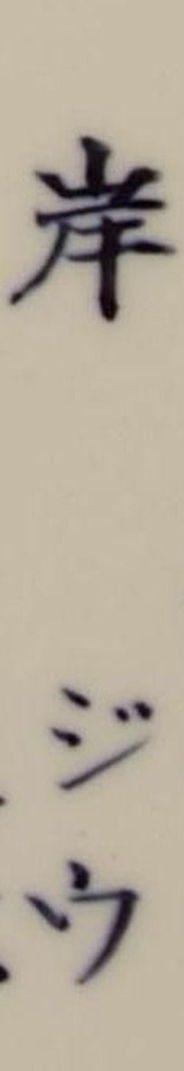岸ジウ
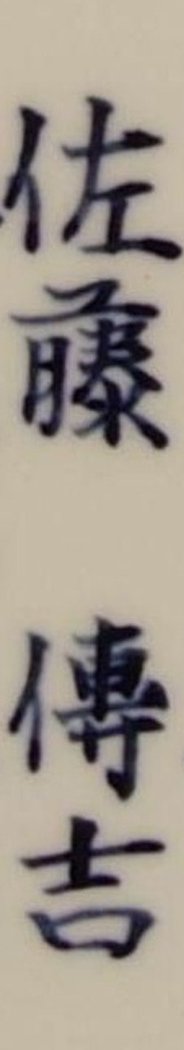佐藤傳吉
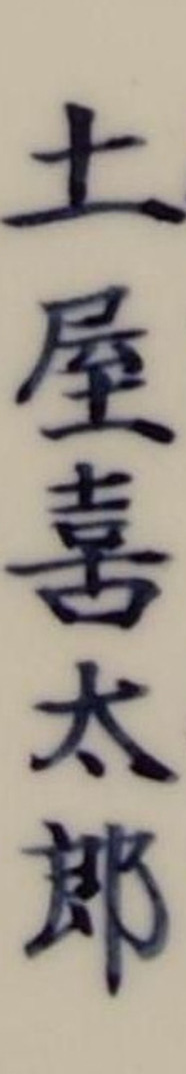土屋喜太郎
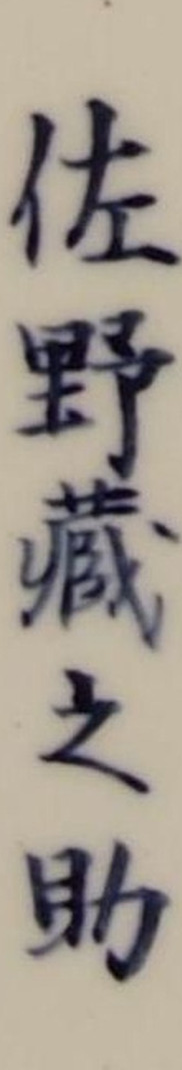佐野蔵之助
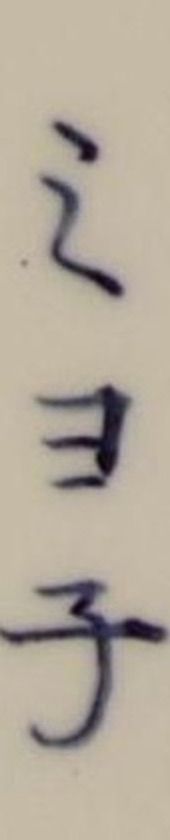ミヨ子
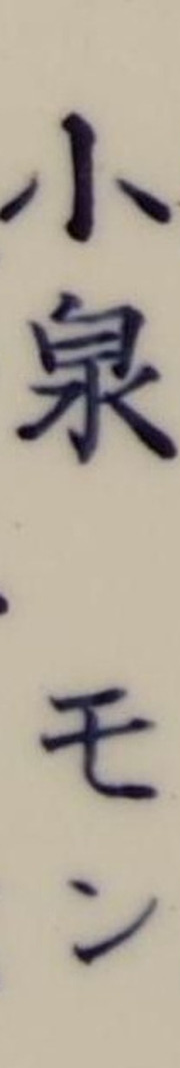小泉モン
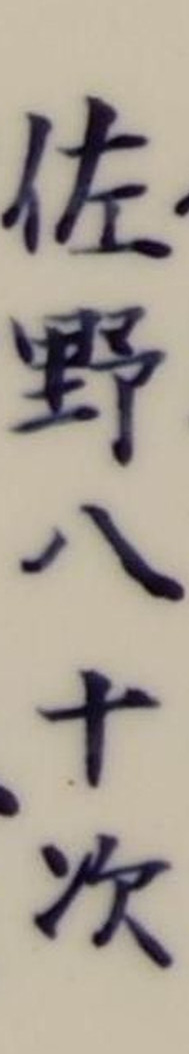佐野八十次

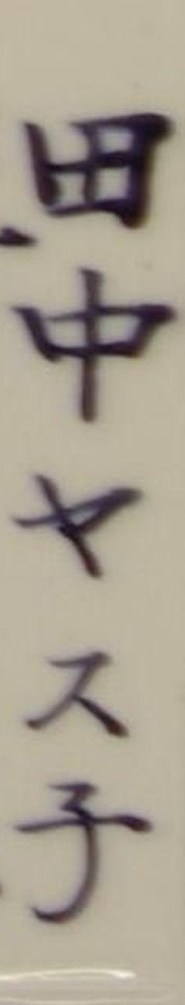田中ヤス子
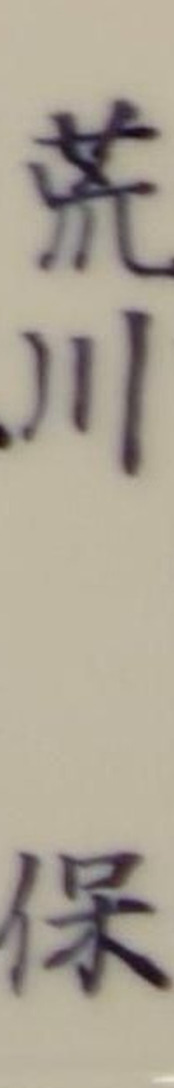荒川保
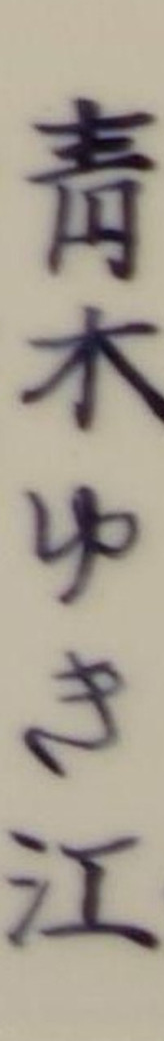青木ゆき江
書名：M~S
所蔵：高野山金剛峯寺
